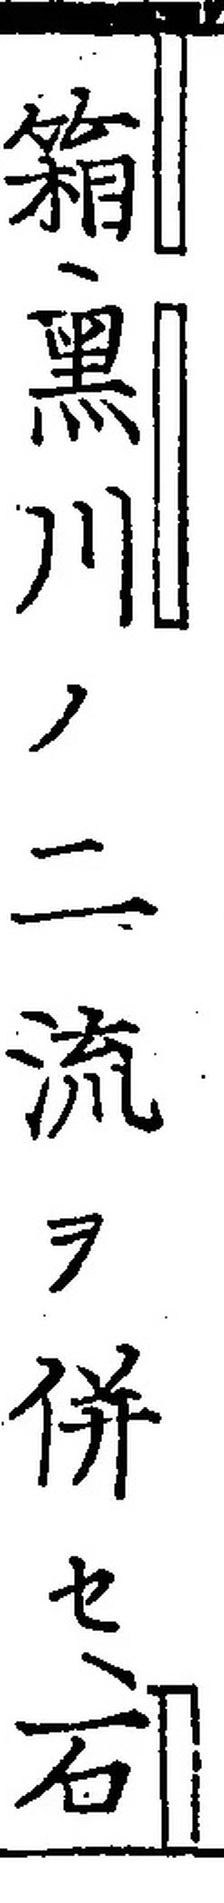箱・黒川ノ二流ヲ併セ、石
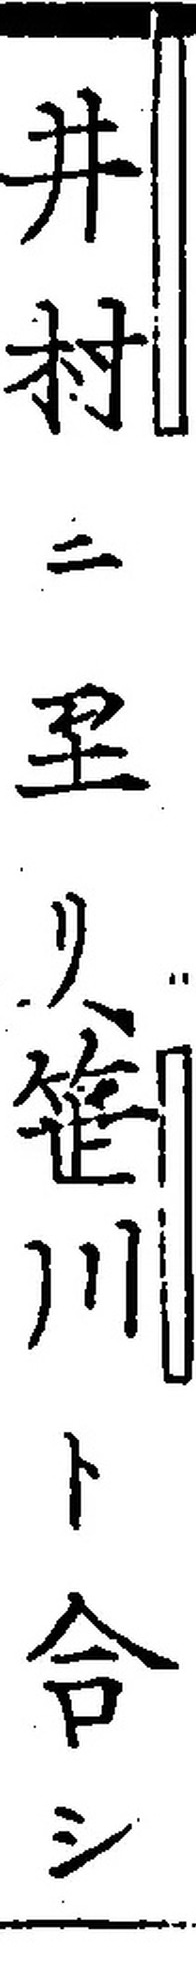井村ニ至リ、笹川ト合シ

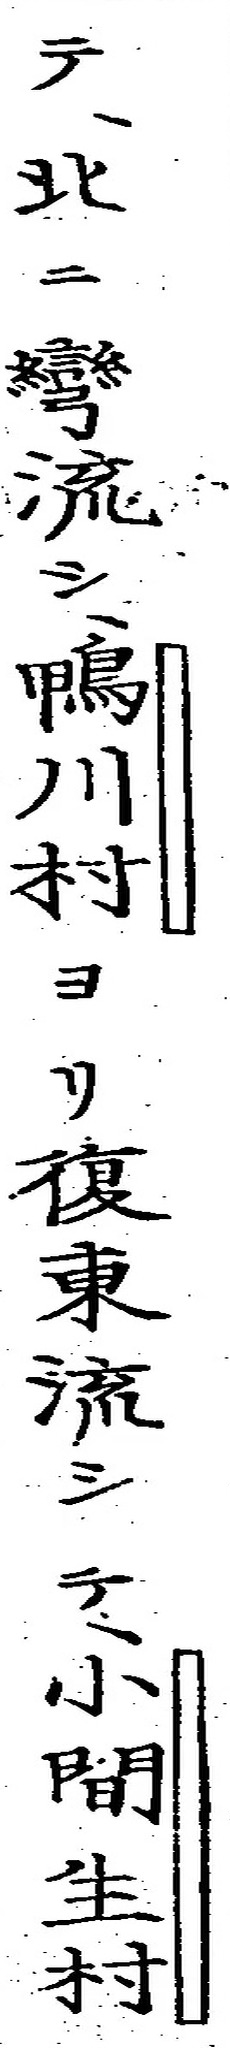テ、北ニ彎流シ、鴨川村ヨリ復東流シテ、小間生村
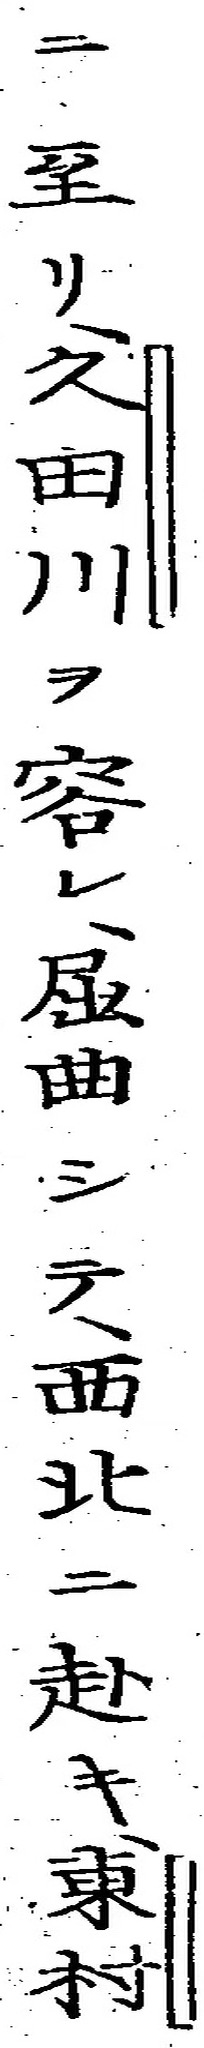ニ至リ、久田川ヲ容レ、屈曲シテ、西北ニ赴キ、東村
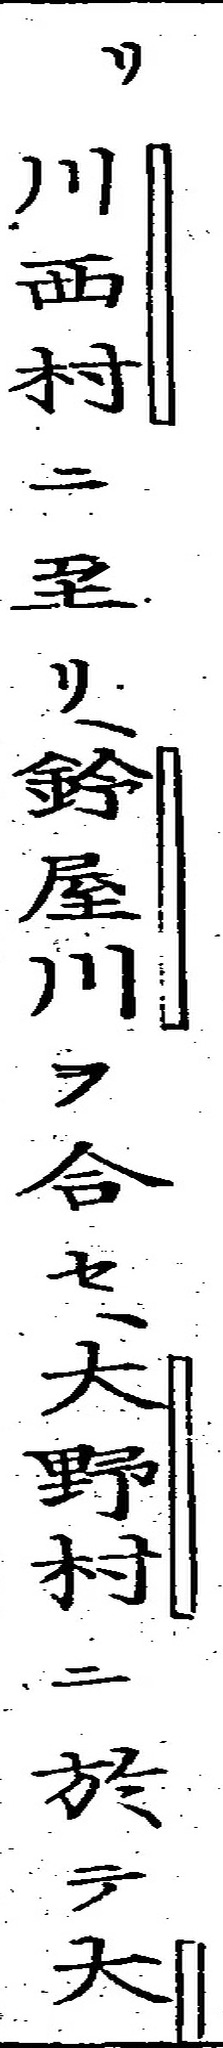リ川西村ニ至リ、鈴屋川ヲ合セ、大野村ニ於テ大
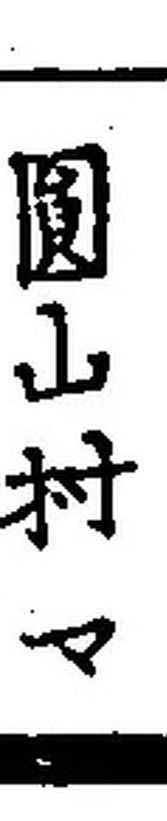円山村マ
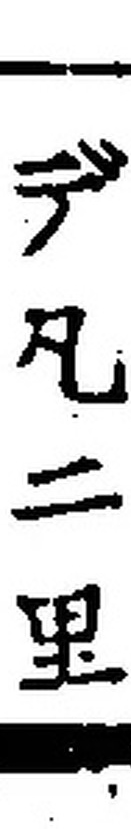デ凡二里
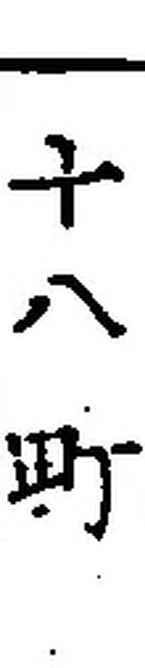十八町
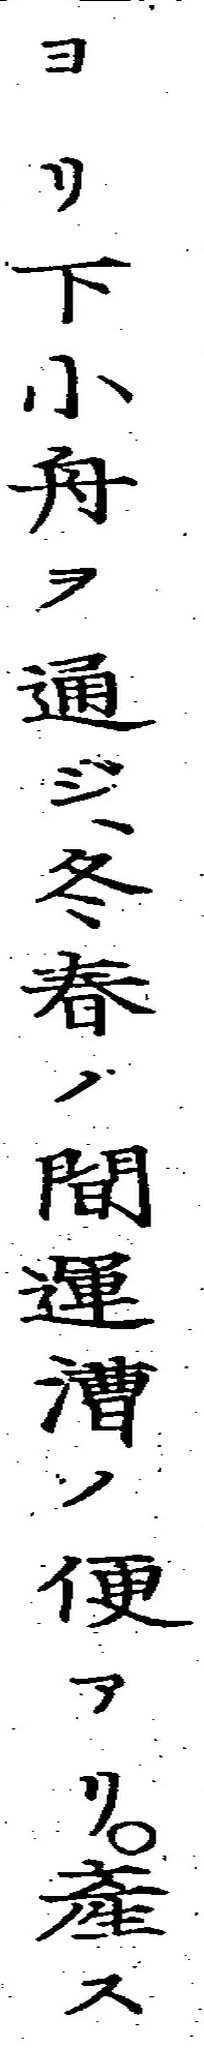ヨリ下小舟ヲ通ジ、冬春ノ間運漕ノ便アリ。産ス
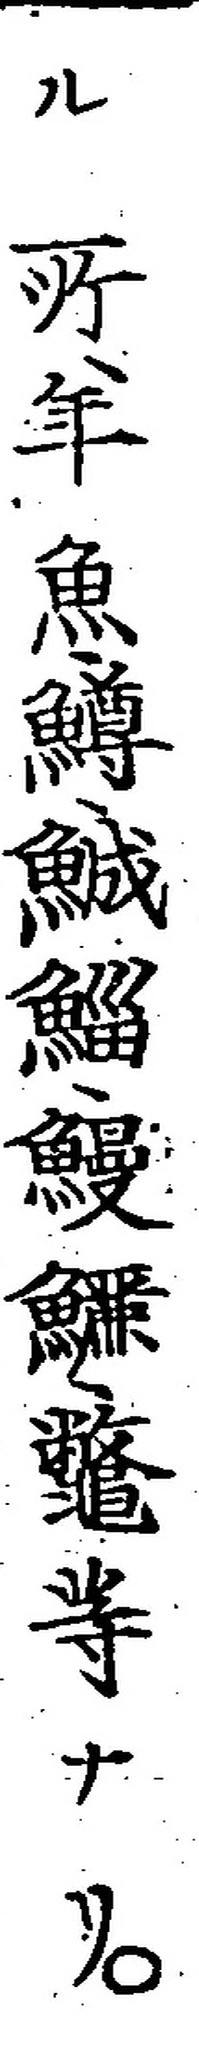ル所、年魚・鱒・鯎鯔・鰻鱺・鼈等ナリ。
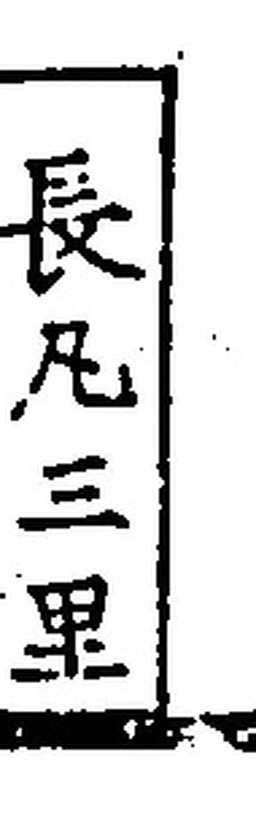長凡三里
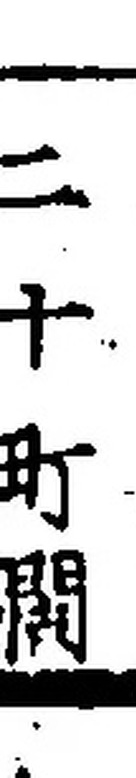二十町闊
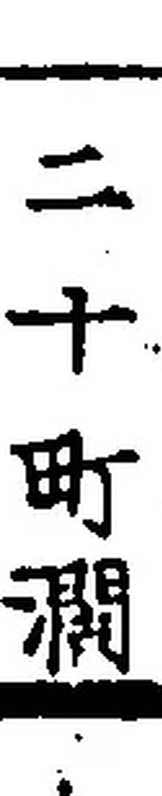二十町闊
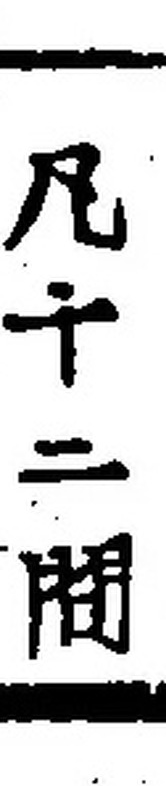凡十二間
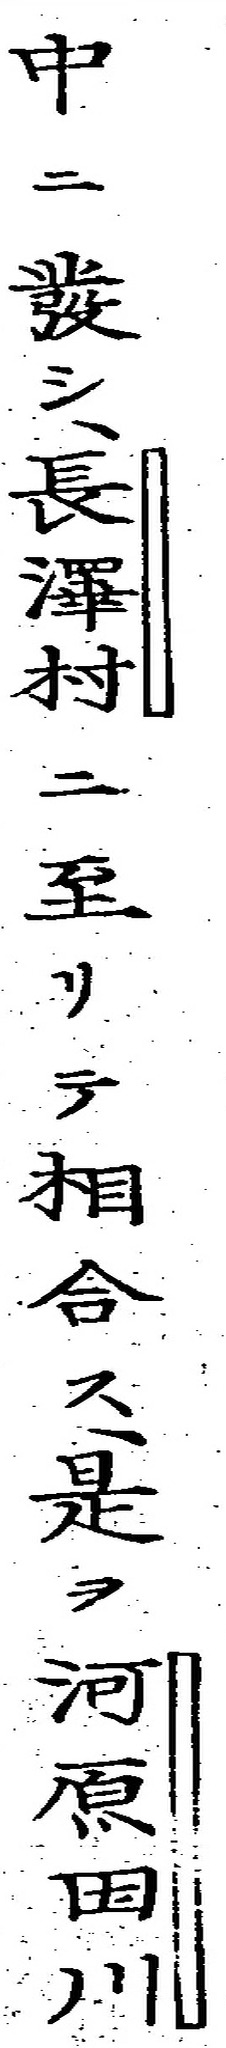中ニ発シ、長沢村ニ至リテ相合ス、是ヲ河原田川
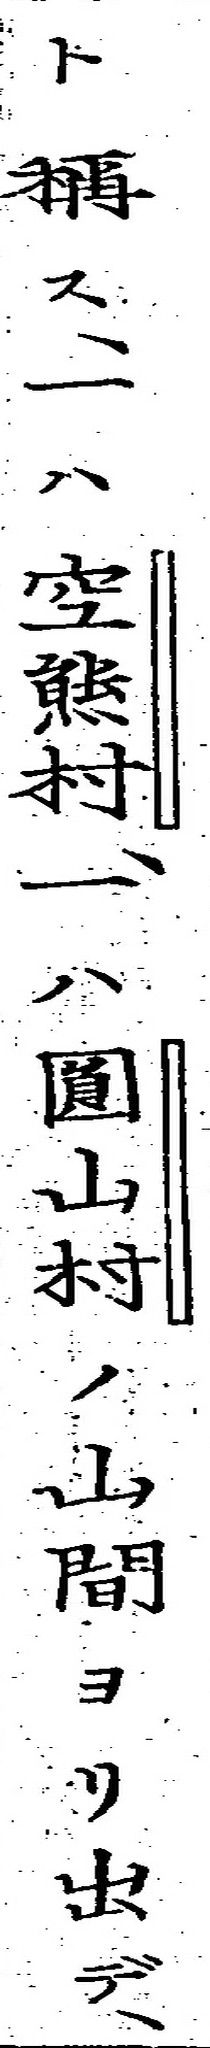ト称ス、一ハ空熊村、一ハ円山村ノ山間ヨリ出デ、
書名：能登地誌略
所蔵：国立国会図書館 National Diet Library, JAPAN
